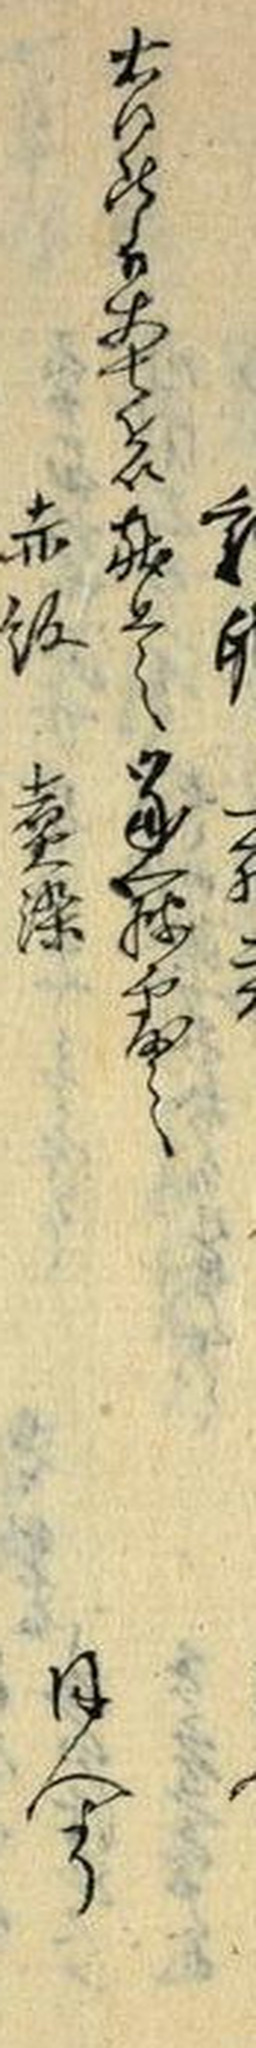赤飯煮染同人より
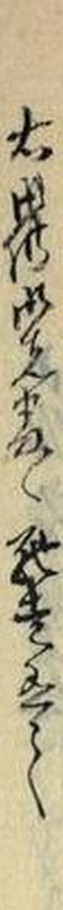右御供御先番へ馳走有之
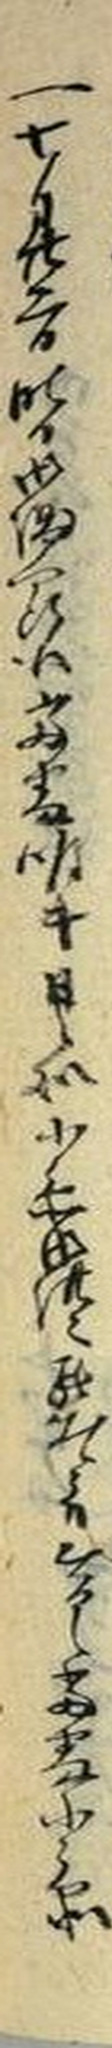一七月廿二日昨日御側向頭取当番明キ日之処小兵衛御供ニ罷出候ニ付今日之当番小兵衛
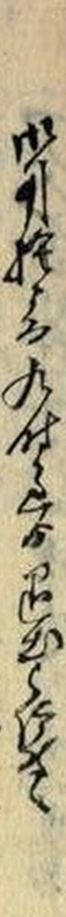御用捨ニ而九時過ゟ退出被仰付候
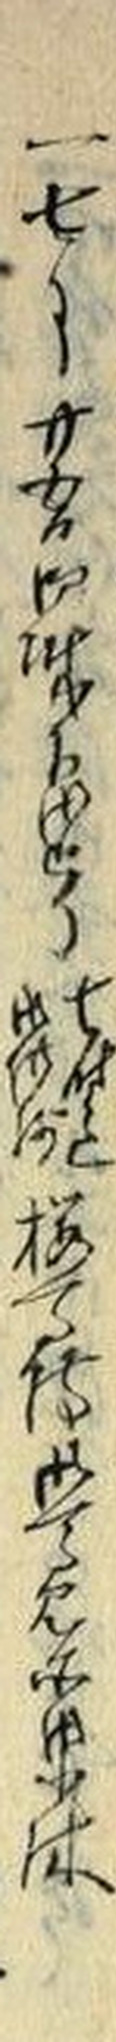一七月廿五日御城下廻り七時過御供揃桜馬場御馬見所御小休
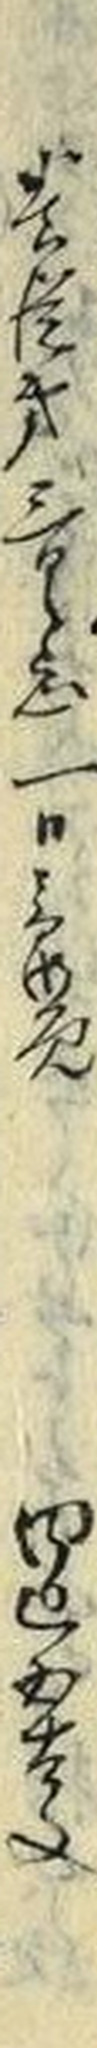養従弟三日忌一日ニ而御免田辺五太夫
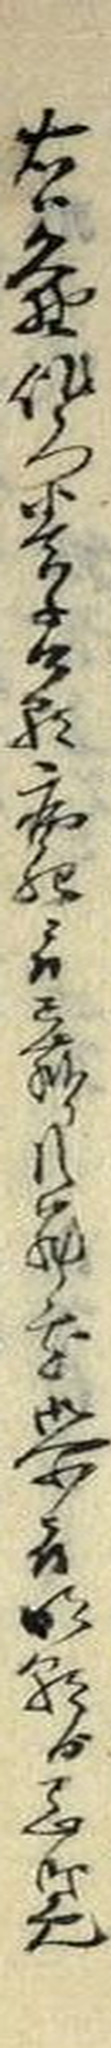右ハ久野作右衛門養子今朝病死ニ付忌始り引籠候処御人少ニ付
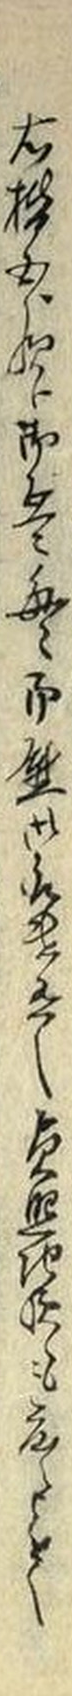右揩五郎様江御互ニ毎々御慰御取遣有之貞照院様へも度々被進之
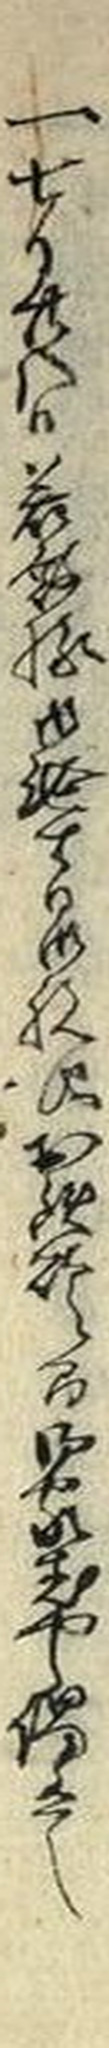一七月廿八日若殿様御誕生日御祝儀於鉄炮之間御家老中謁有之
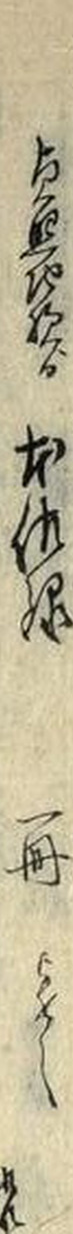貞照院様ゟ本佐録一冊被進之
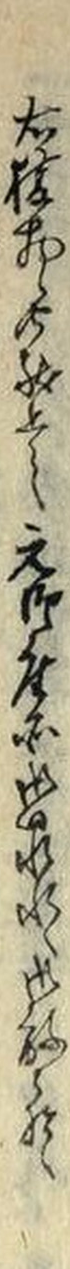右獲物之由献上之元御座所御泉水へ御放被遊候

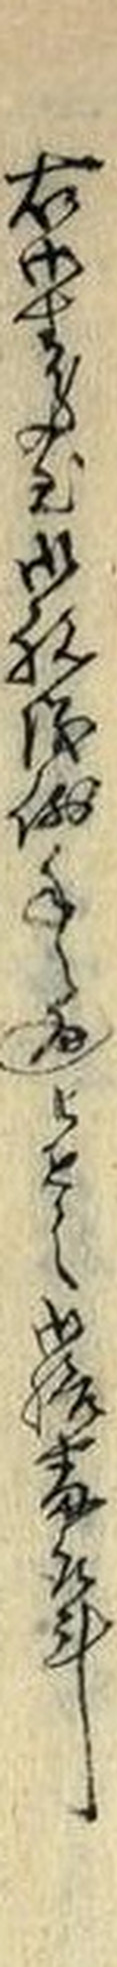右御生身玉御祝儀例年之通被進之御膳番取斗
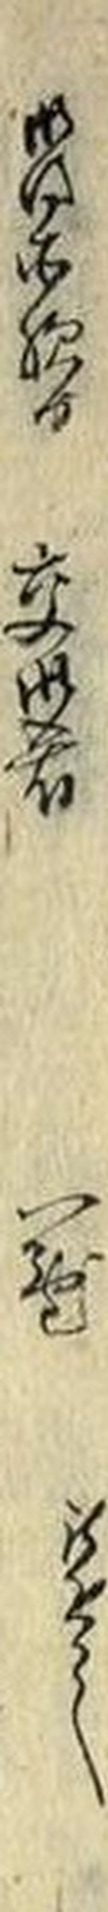御同所様ゟ交御肴一台被進之
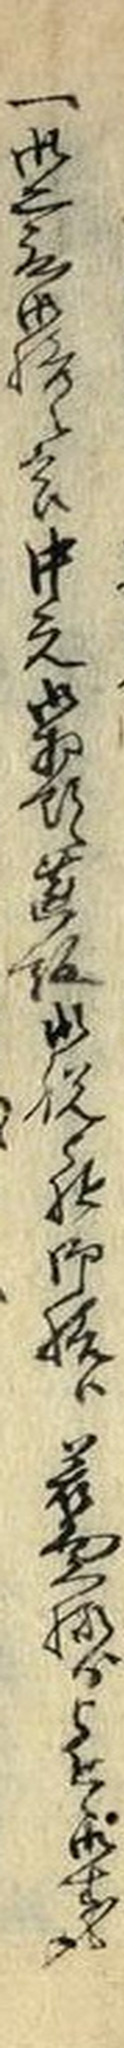一御二度御膳之節中元御拝領候蓮飯御祝被遊御膳ハ若殿様ゟ被進候御生身
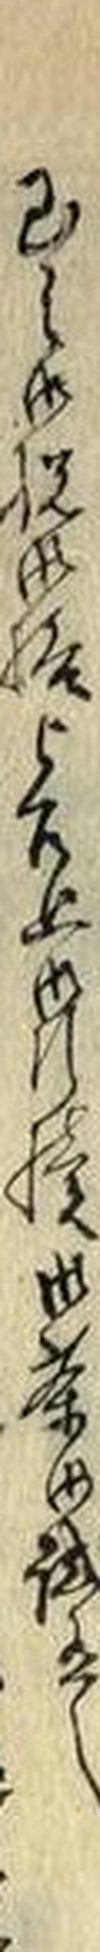玉之御祝御膳被召上御引続御茶御試有之
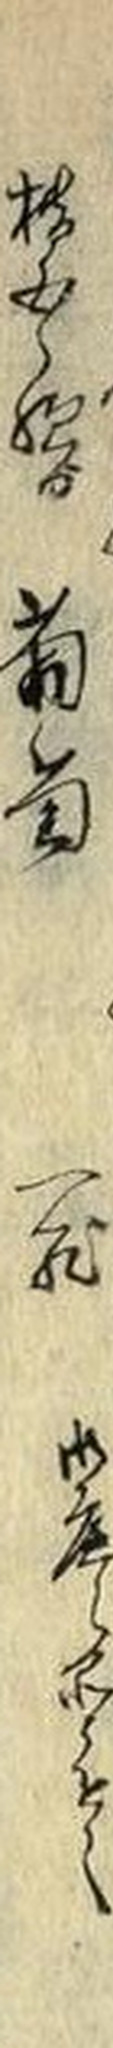揩五郎様ゟ葡萄一籠御庭之品被進之
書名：少傅日録抄（斉承付側向頭取日記、在国）
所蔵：福井県文書館 Fukui Prefectural Archives
